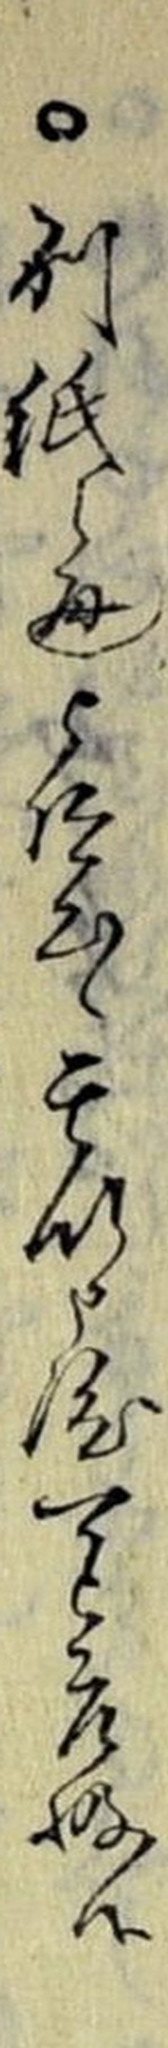○別紙之通被仰出候其段申渡可被取扱候
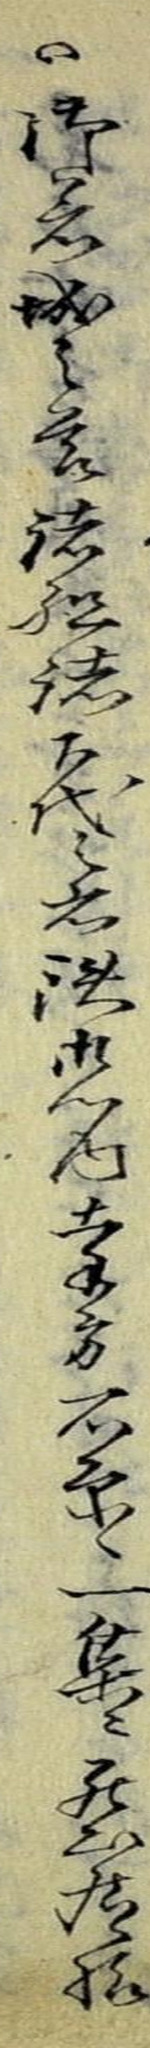○御着城之節諸組諸下代之者鉄御門土手方石原へ一集に罷出居候様
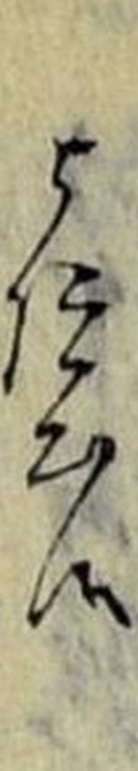被仰出候
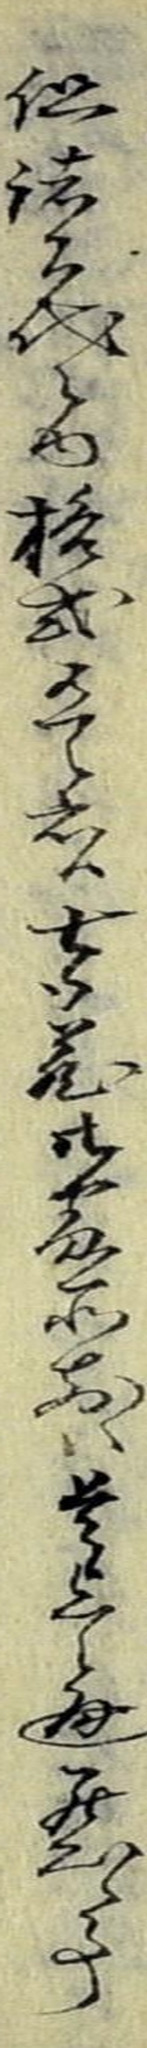但諸下代之内格式有之者は七ッ蔵御番所前へ是迄之通罷出候事
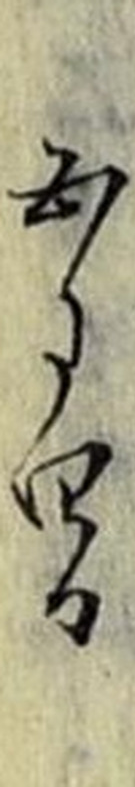五月四日
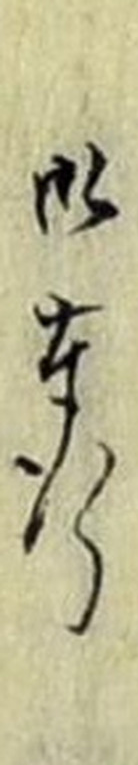御奉行
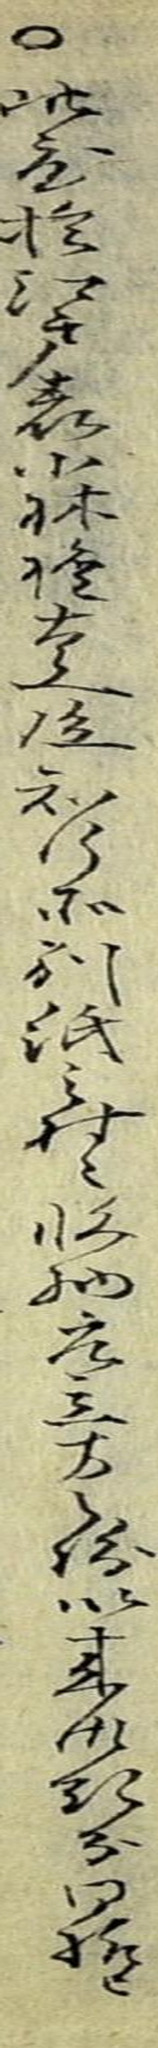○此度江戸表小林権太夫殿知行所別紙之村々収納取立方之儀以來御領分同様被
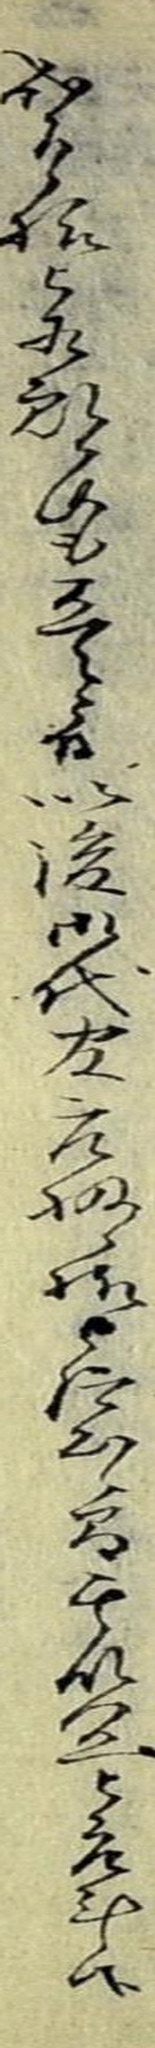成下候様被相願候趣も有之候に付以後御代官取扱候様被仰出候間其段宜被取斗候
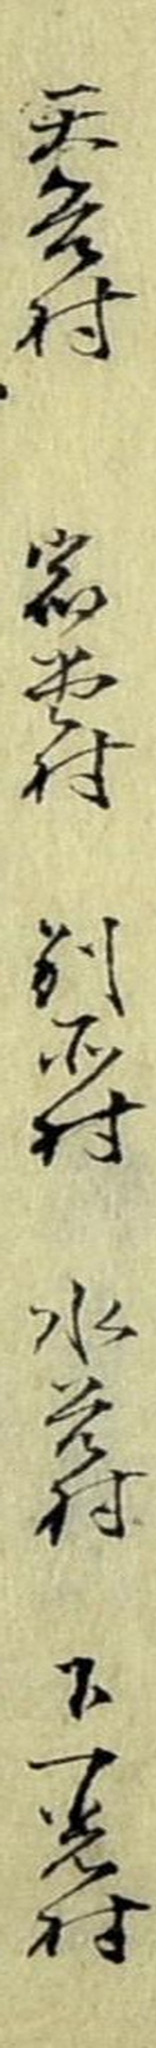天谷村宿堂村別所村水谷村下一光村
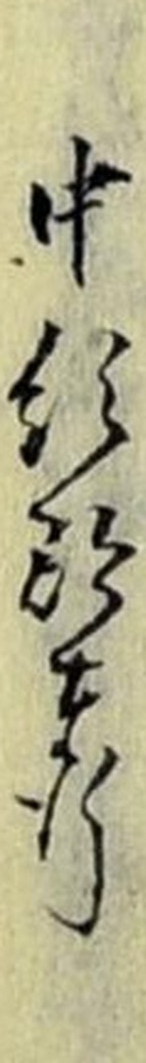中領郡奉行

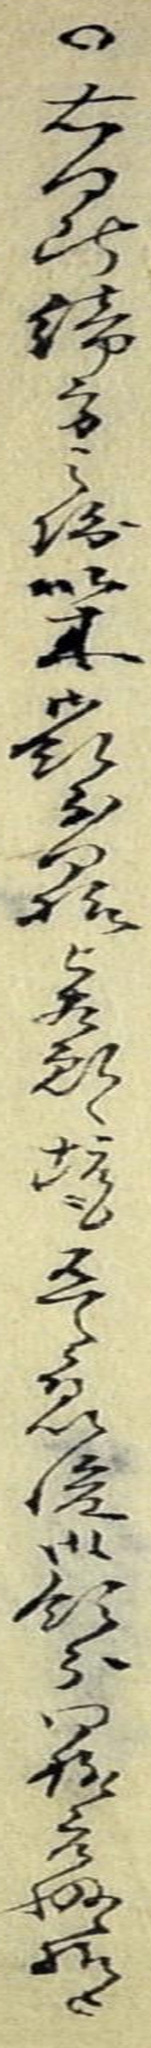○右同断締方之儀以來御領分同様被相願候趣も有之候に付以後御領分同様取扱候様被
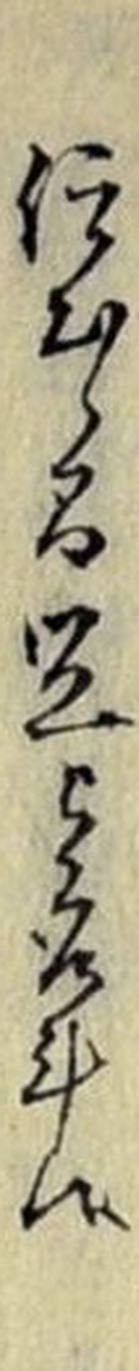仰出候間宜被相取斗候
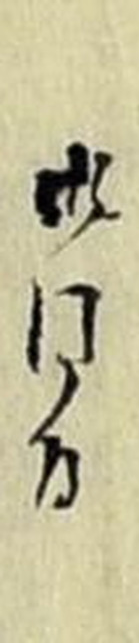御目付
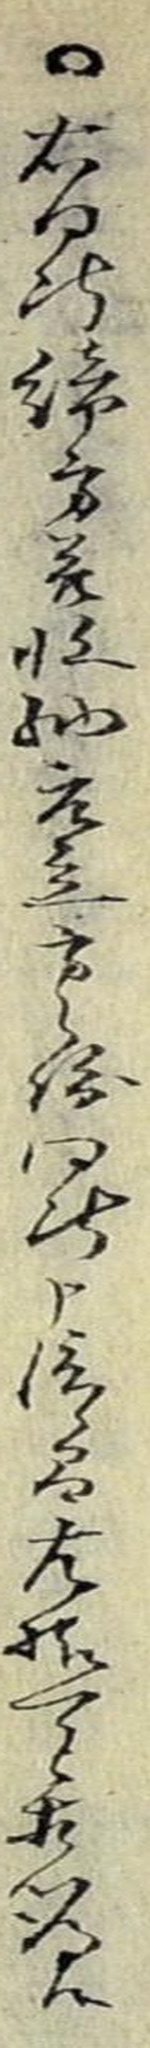○右同断締方并収納取立方之儀同断申渡候間左様可被相心得候
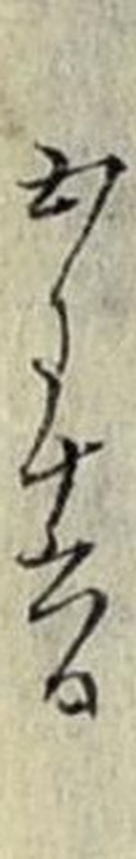五月十六日
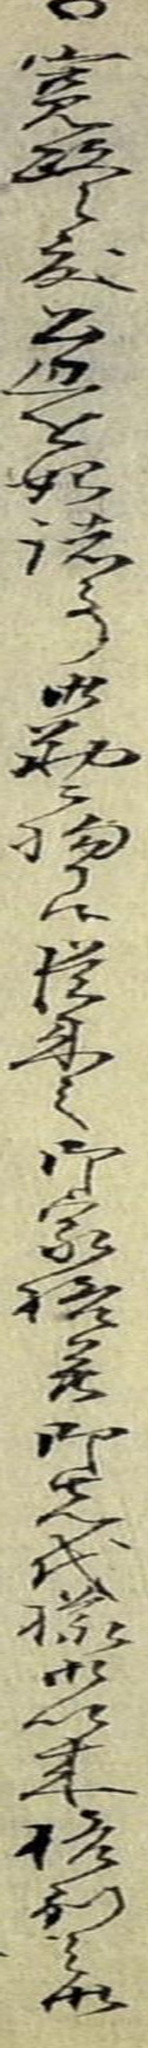○寛政之度公辺を始諸事御勤に拘り候従來之御家格并御先代様御以來格別之御
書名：命令之部 六
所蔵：福井県文書館 Fukui Prefectural Archives
